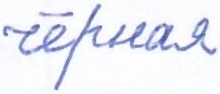чёрная
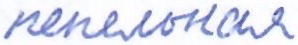пепельная
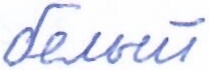белый
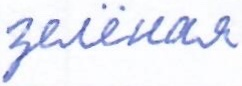зелёная
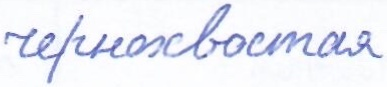чернохвостая
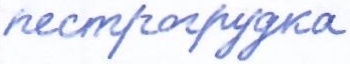пестрогрудка
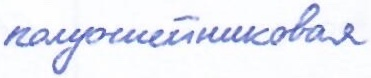полуошейниковая
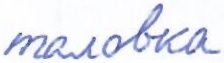таловка
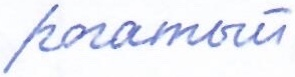рогатый
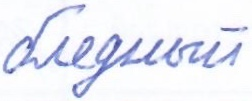бледный
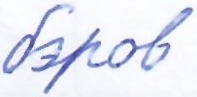бэров
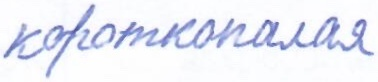короткопалая
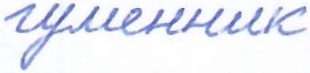гуменник
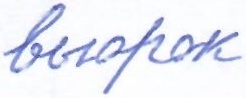вьюрок
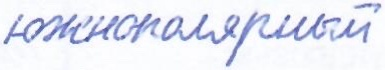южнополярный
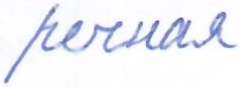речная
